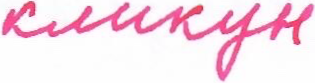кликун
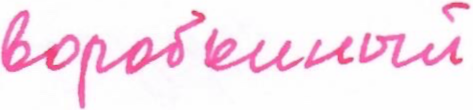воробьиный
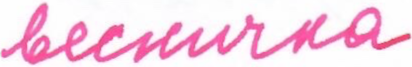весничка
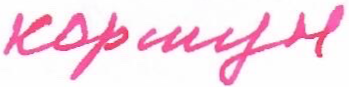коршун
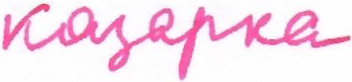казарка
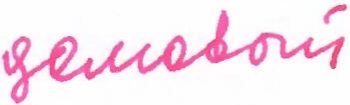домовый
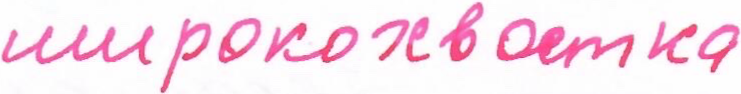широкохвостка
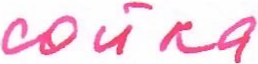сойка
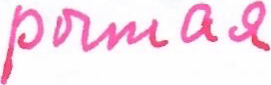рыжая
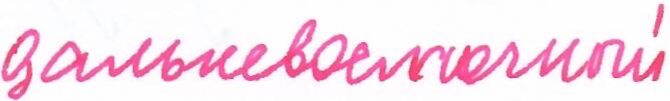дальневосточный
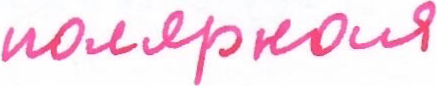полярная
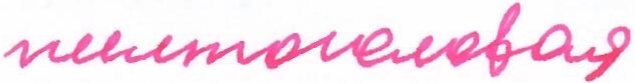желтоголовая
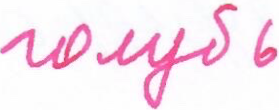голубь
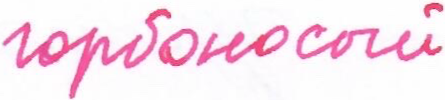горбоносый
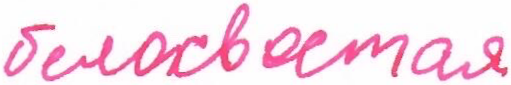белохвостая
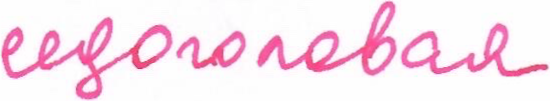седоголовая
